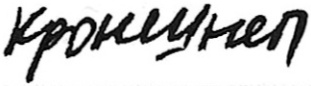кроншнеп
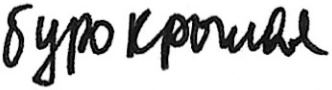бурокрылая
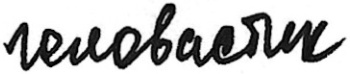головастик
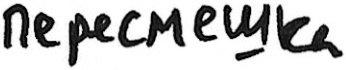пересмешка
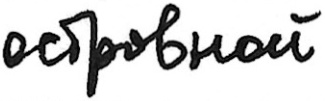островной
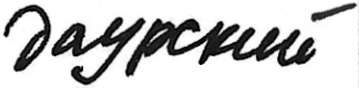даурский
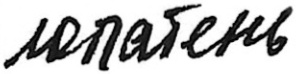лопатень
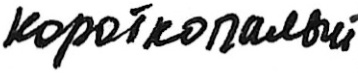короткопалый
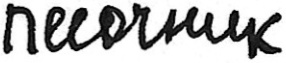песочник
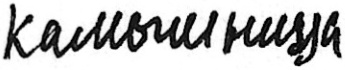камышница
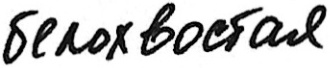белохвостая
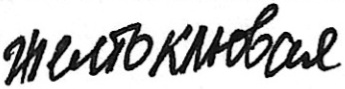желтоклювая
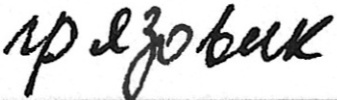грязовик
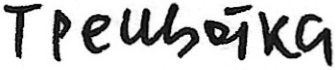трещотка
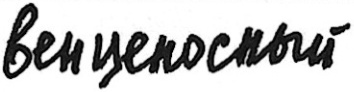венценосный
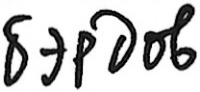бэрдов
